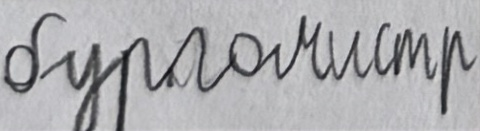бургомистр
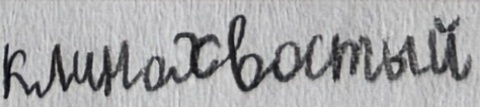клинохвостый
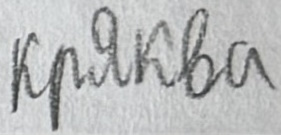кряква
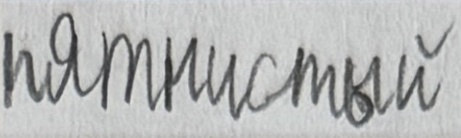пятнистый
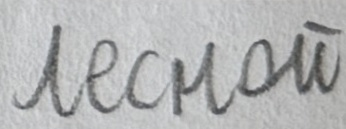лесной
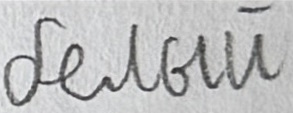белый
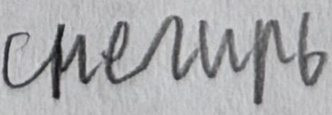снегирь
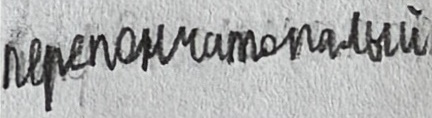перепончатопалый
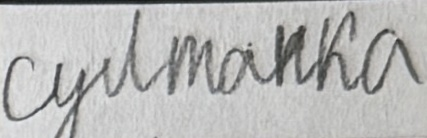султанка
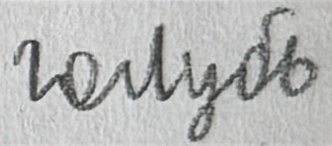голубь
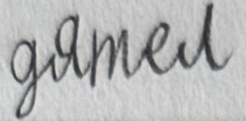дятел
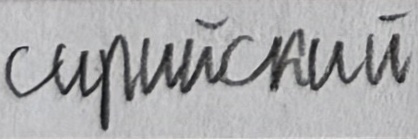сирийский
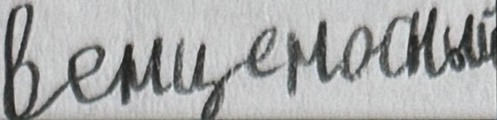венценосный
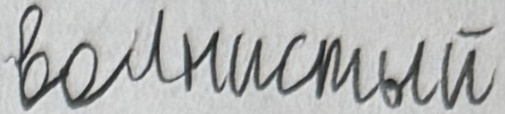волнистый
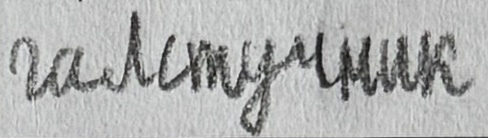галстучник
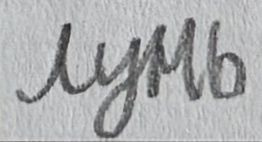лунь
